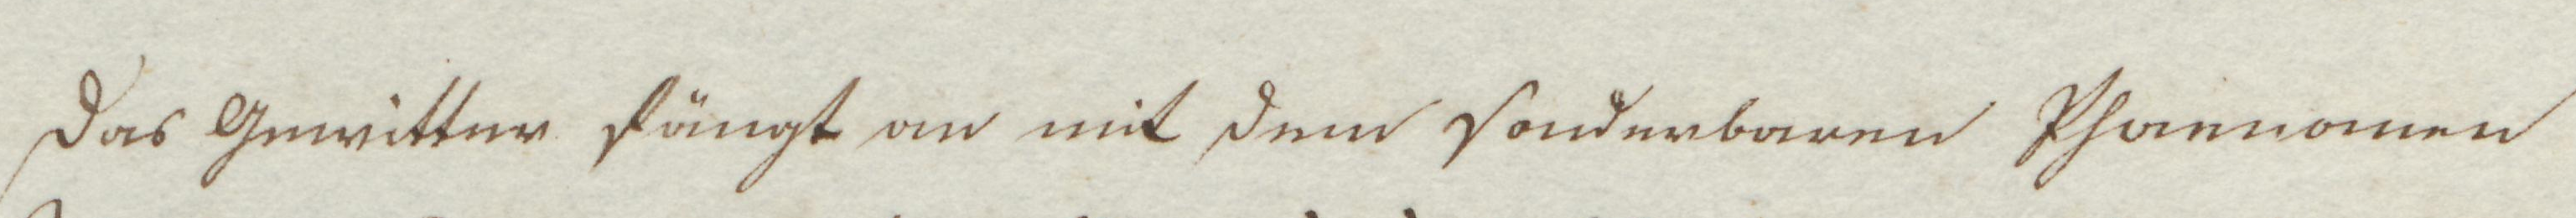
Das Gewitter fängt an mit dem sonderbaren Phaenomen
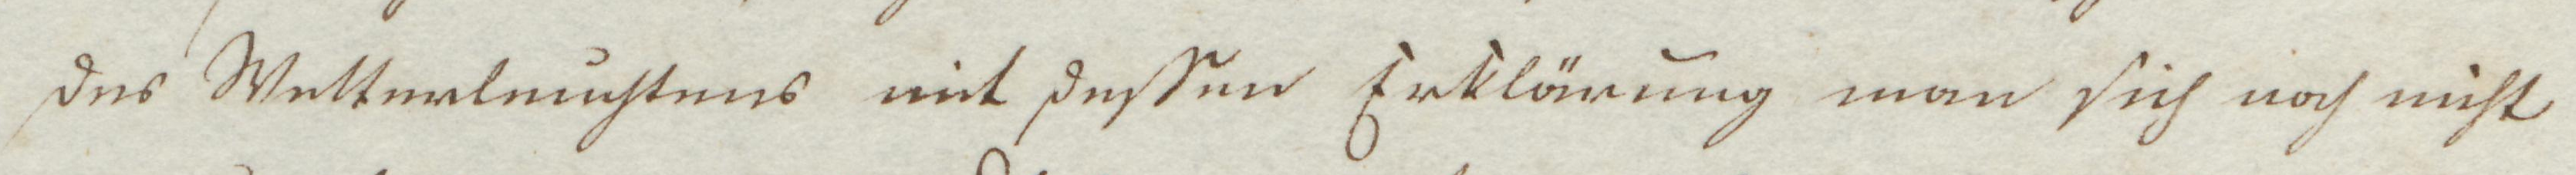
des Wetterleuchtens mit dessen Erklärung man sich noch nicht
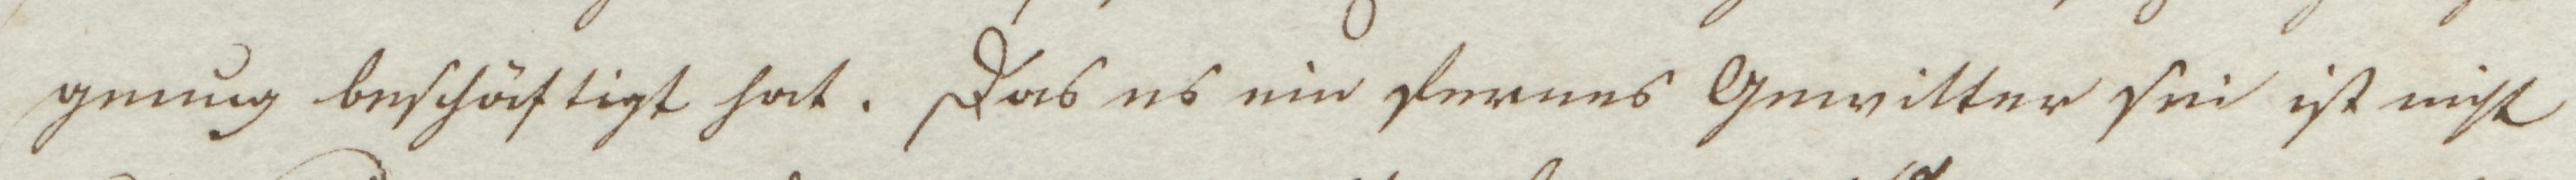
genug beschäftigt hat. es ein fernes Gewitter sei ist nicht
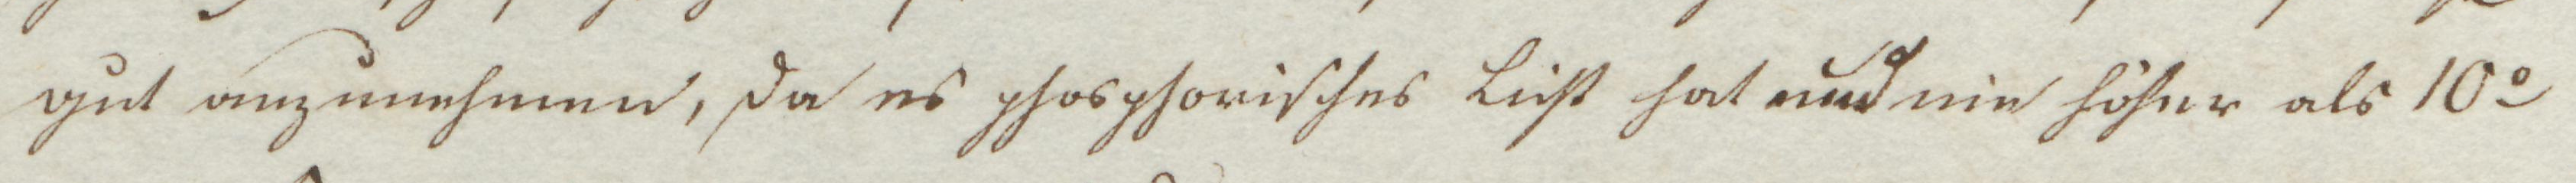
gut anzunehmen, da es phosphorisches Licht hat u.und nie höher als 10°
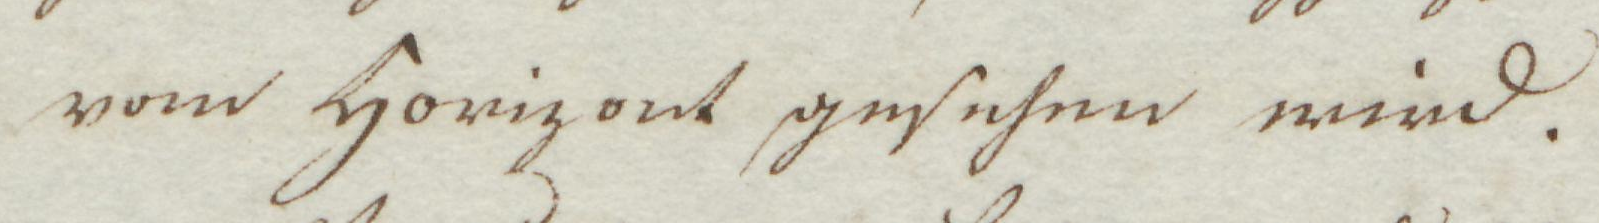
vom Horizont gesehen wird.
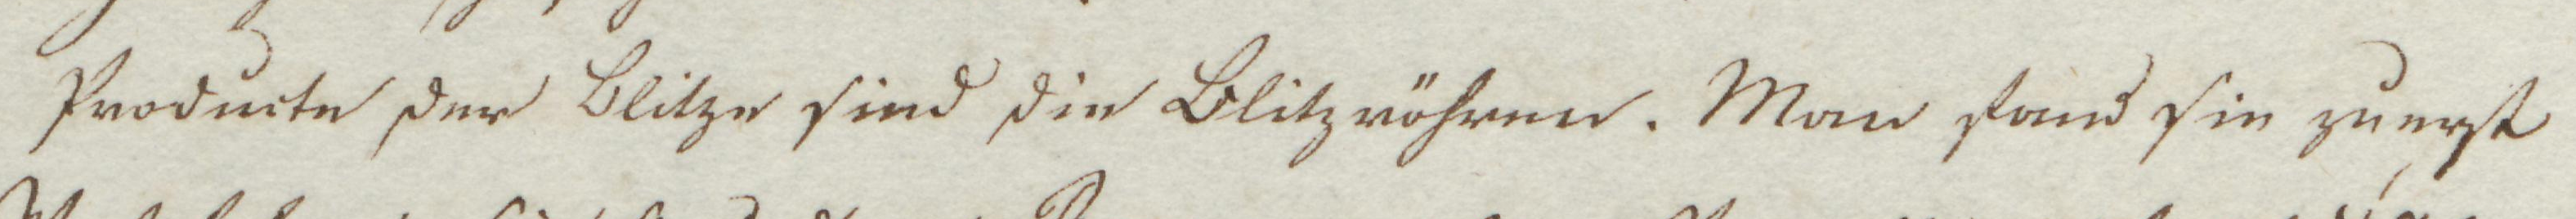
Producte der Blitze sind die Blitzröhren. Man fand sie zuerst
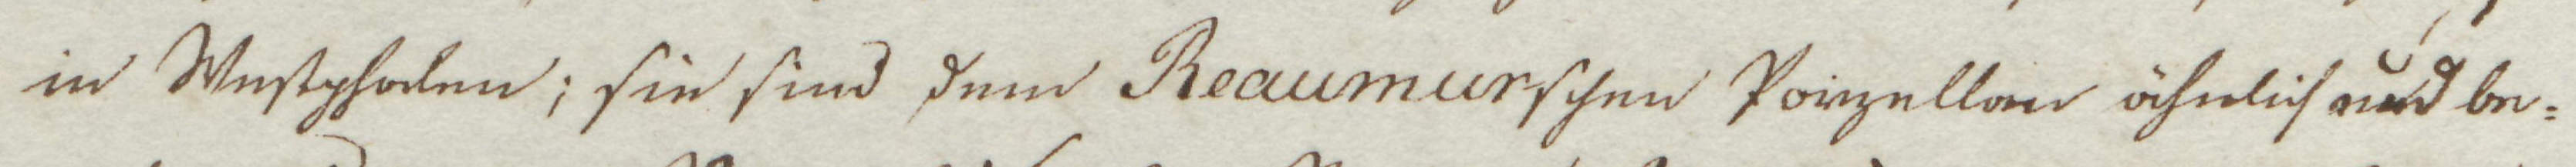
in Westphalen; sie sind dem Reaumurschen Porzellan ähnlich u.und be-
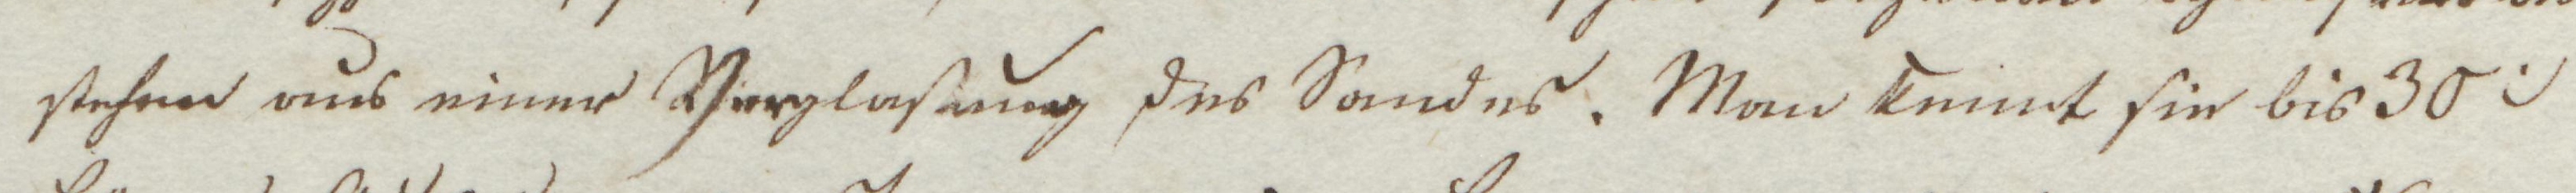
stehen aus einer Verglasung des Sandes. Man kennt sie bis 30′
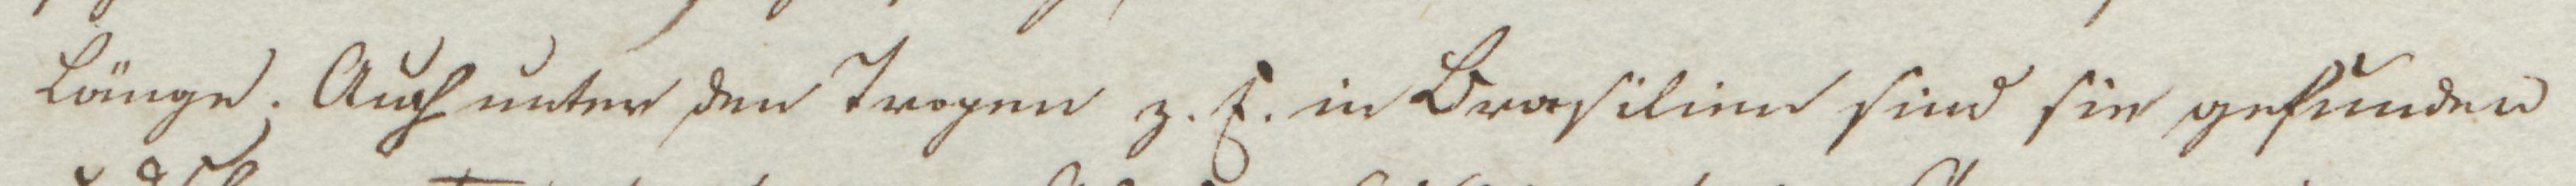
Länge. Auch unter den Tropen z. E. in Brasilien sind sie gefunden
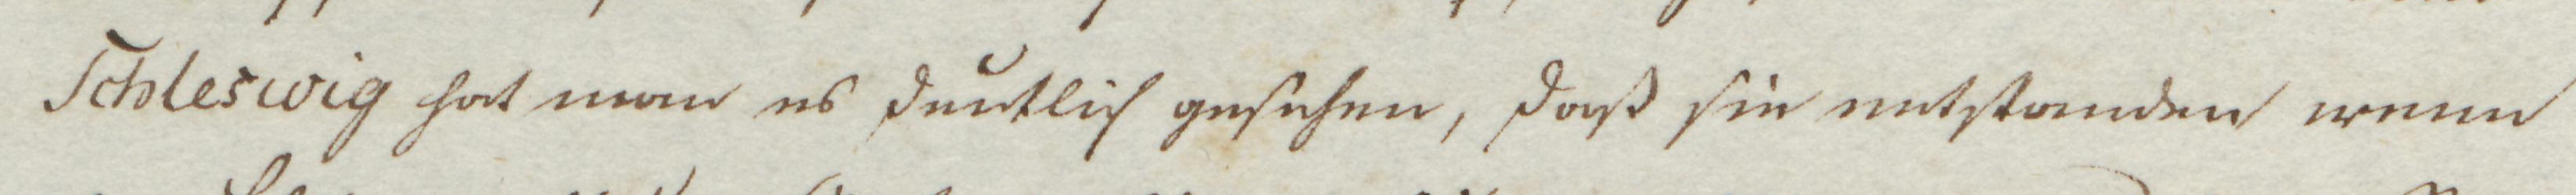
Schleswig hat man es deutlich gesehen, daß sie entstanden wenn
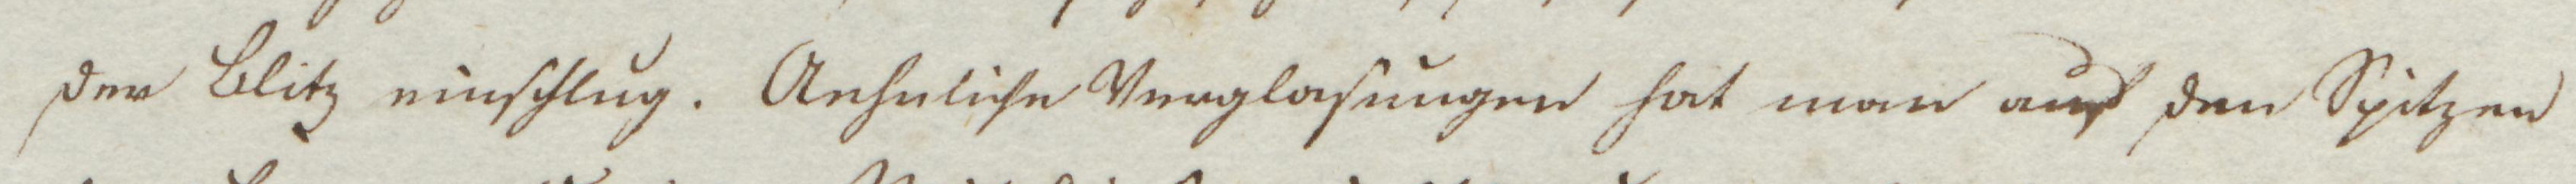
der Blitz einschlug. Aehnliche Verglasungen hat man auf den Spitzen
